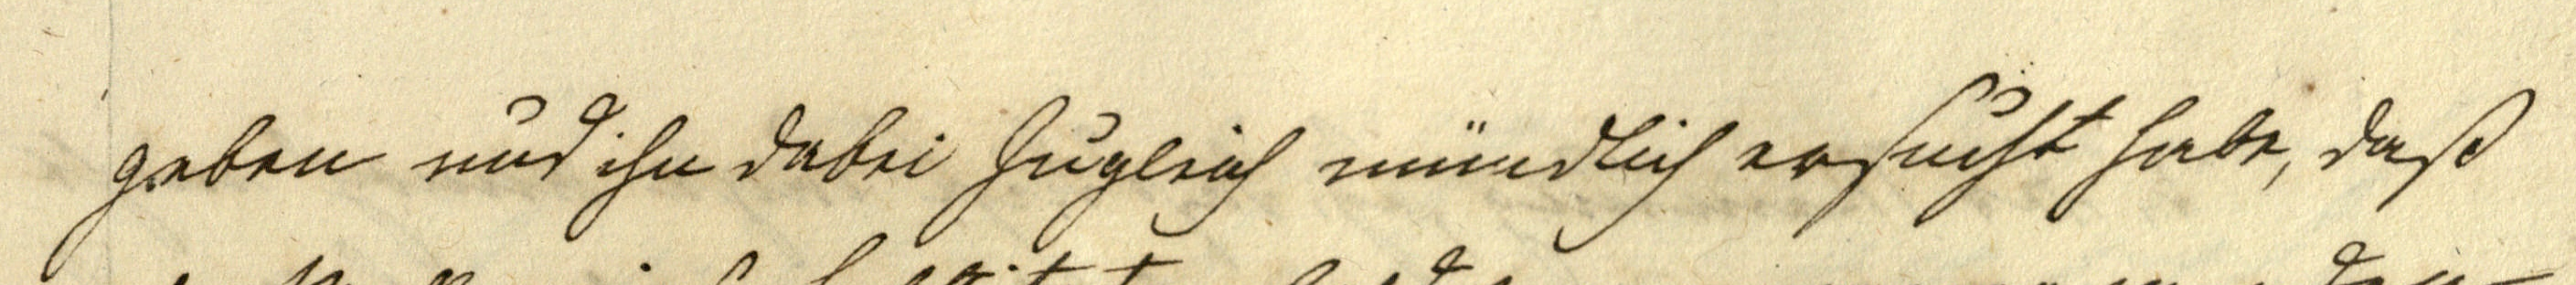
geben und ihn dabei zugleich mündlich ersucht habe, daß
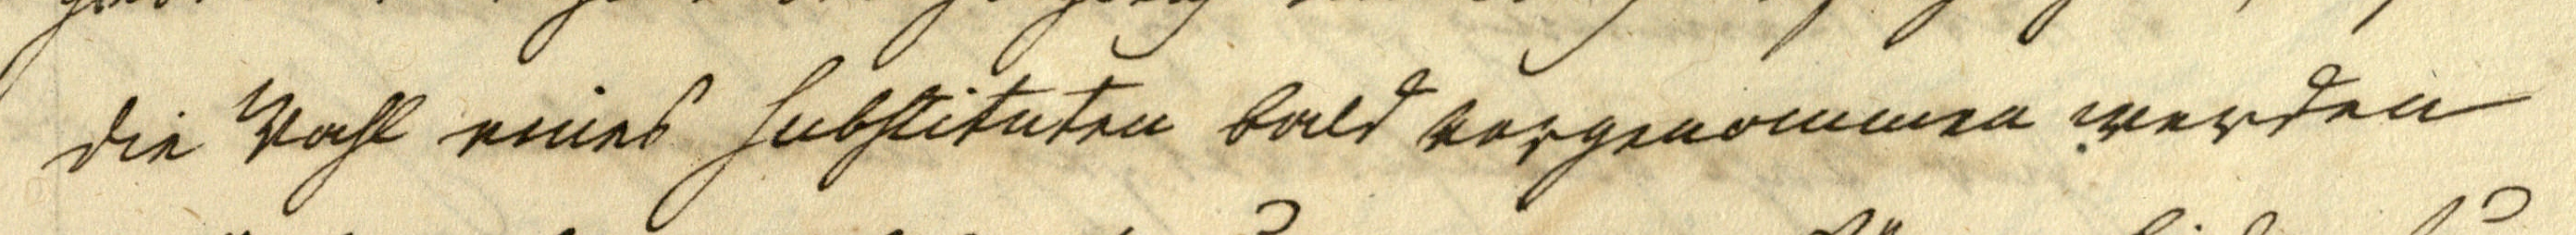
die Wahl eines substituten bald vorgenommen werden
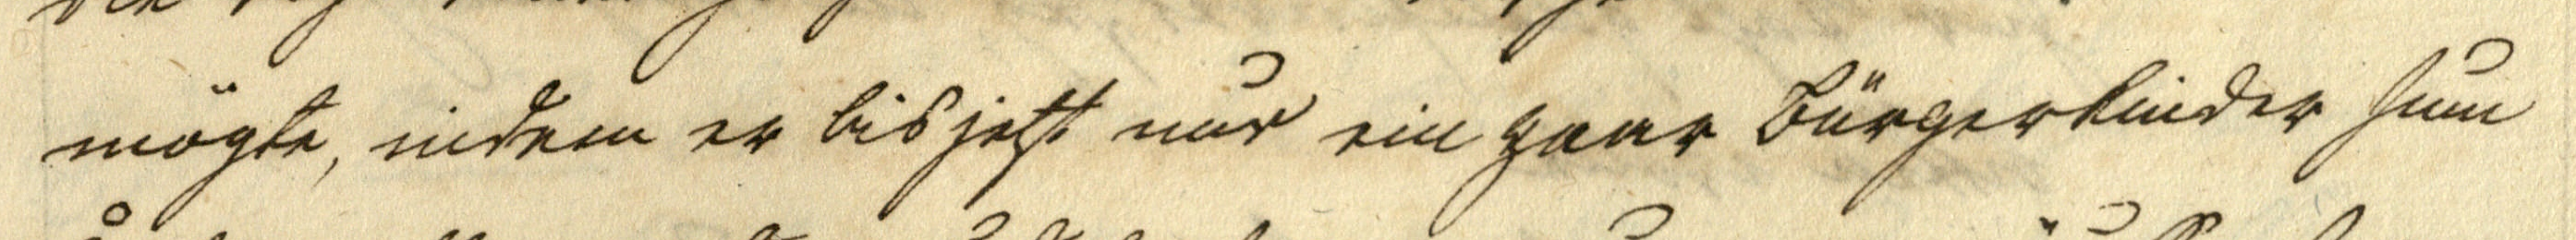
mögte, indem er bis jetzt nur ein paar Bürgerkinder zum
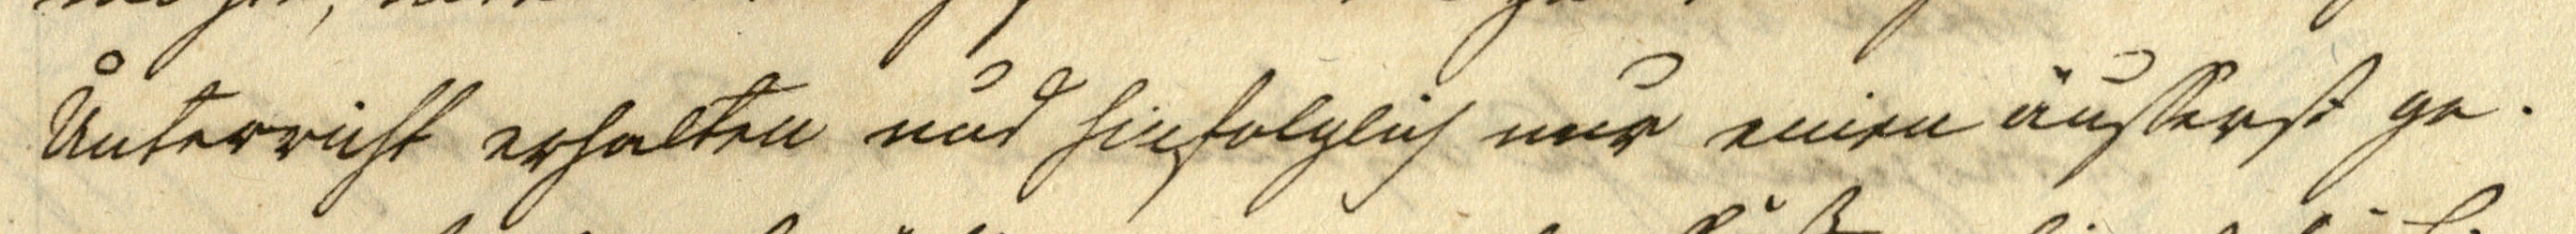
Unterricht erhalten und hinfolglich nur einen äusserst ge-
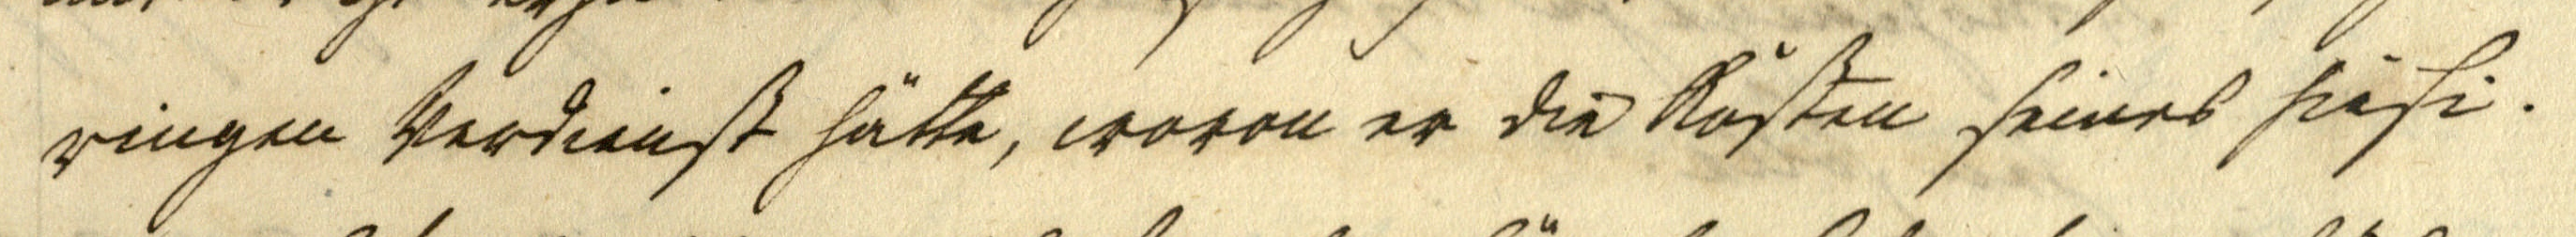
ringen Verdienst hätte, woran er die Kosten seines hiesi-
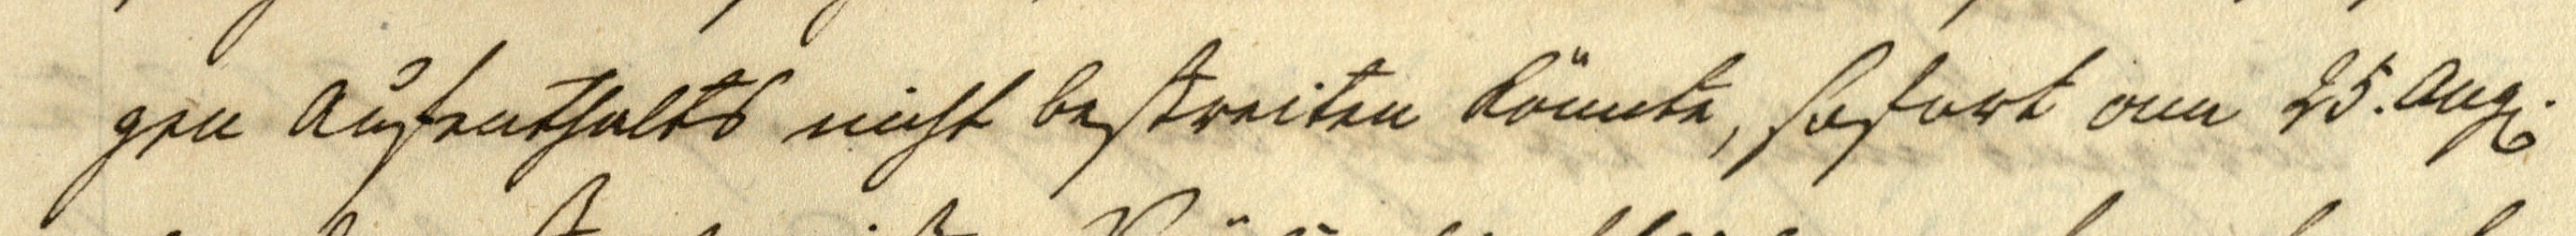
gen Aufenthalts nicht bestreiten könnte, sofort am 25. Aug.
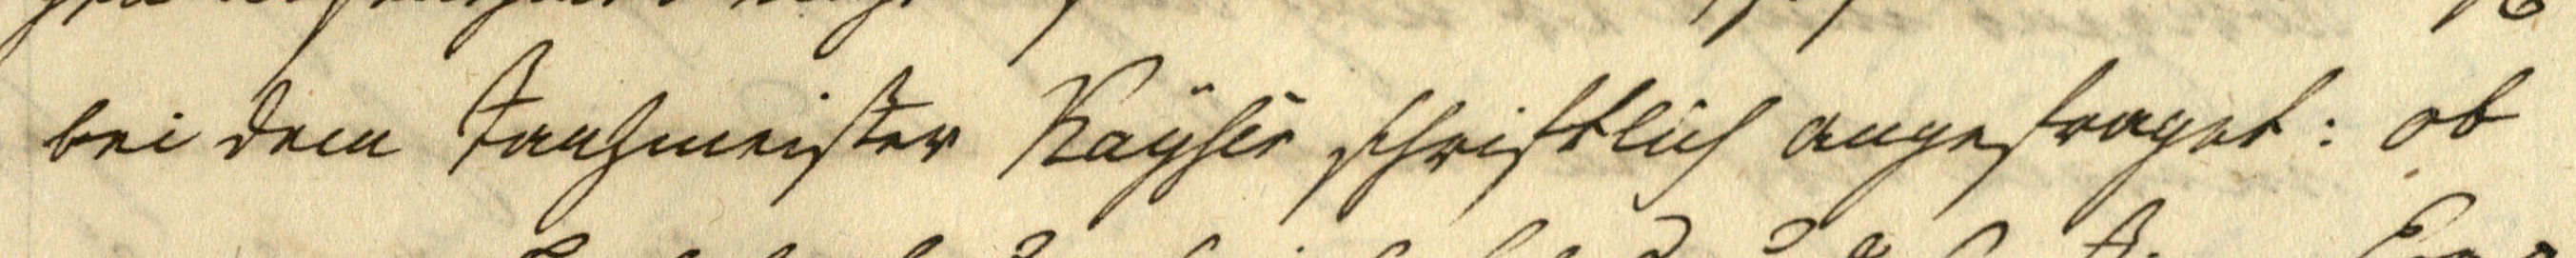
bei dem Tanzmeister Kayser schriftlich angefraget: ob
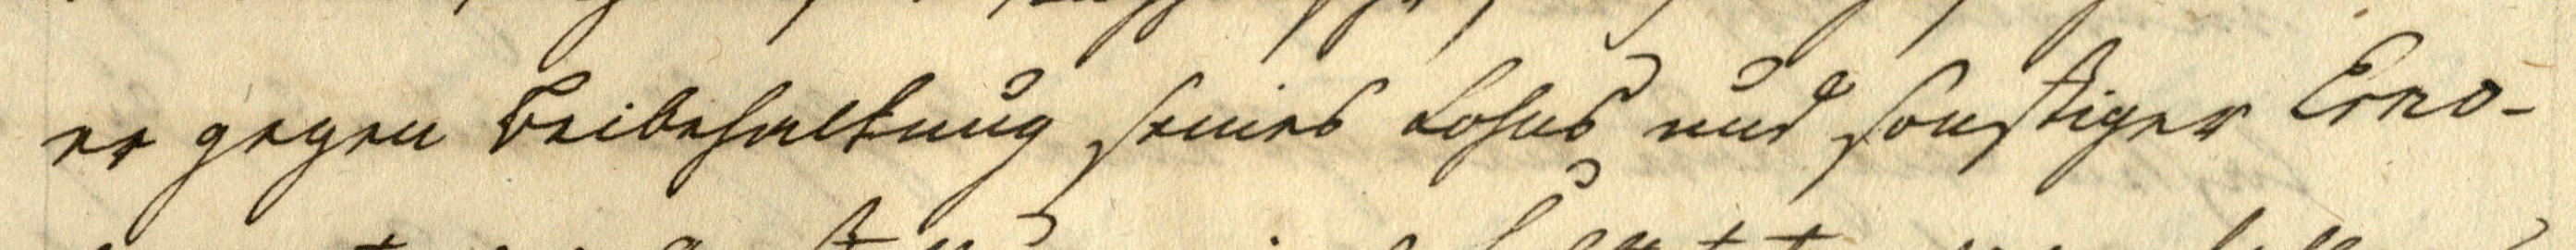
er gegen Beibehaltung seines Lohns und sonstiger Emo-
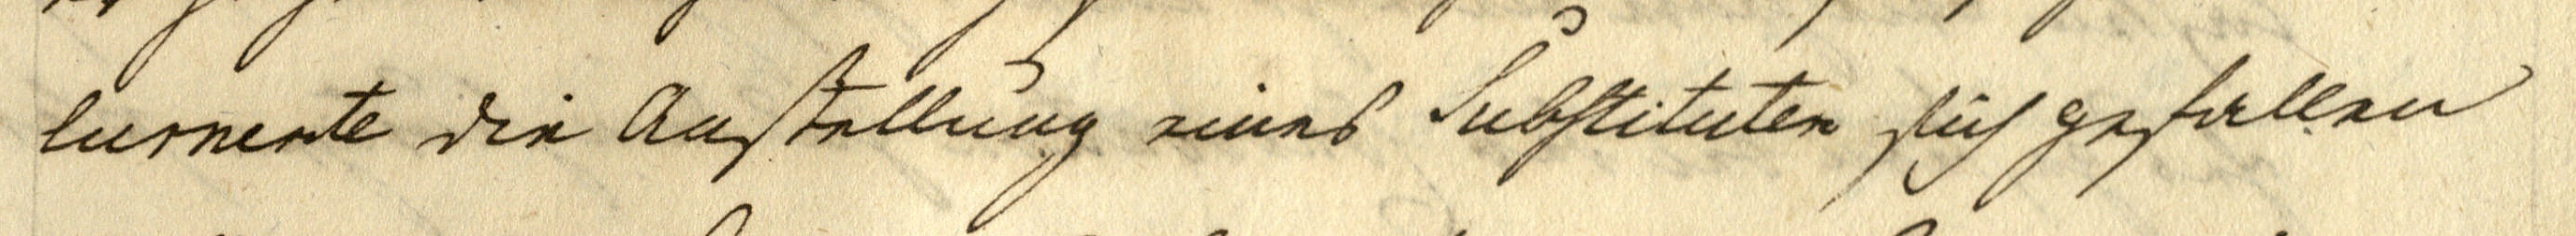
lumente die Anstellung eines Substituten sich gefallen
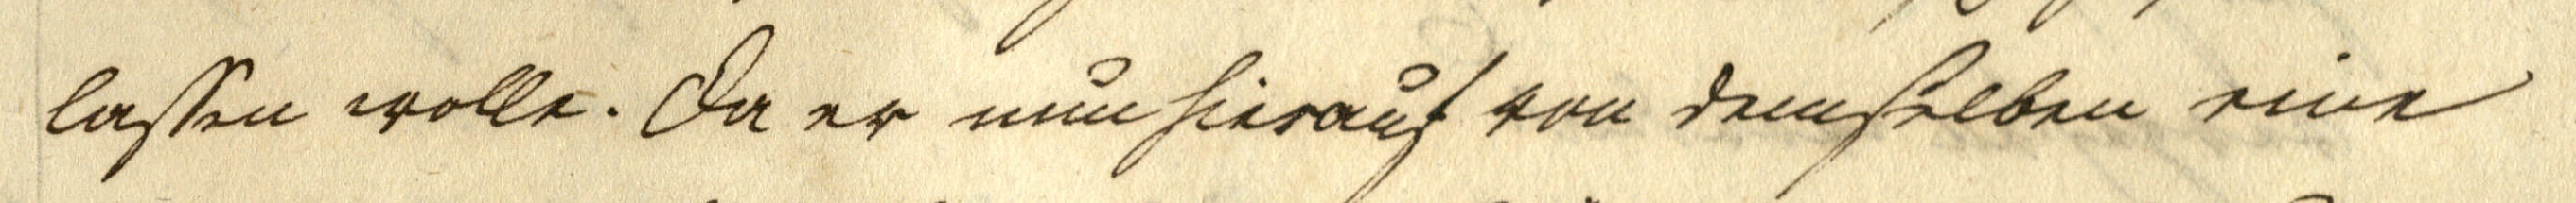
lassen wolle. da er nun hierauf von demselben eine
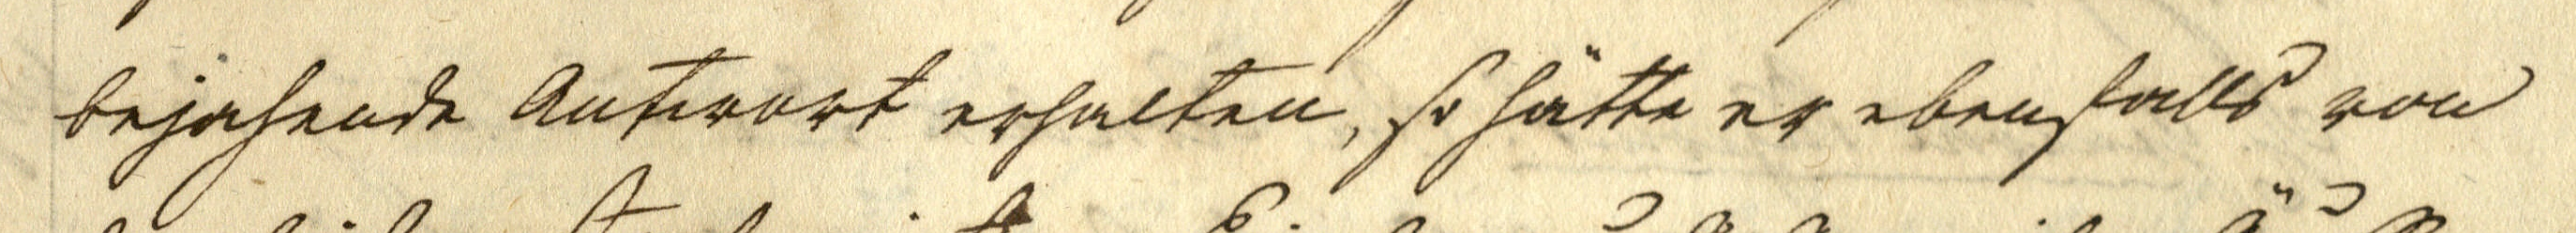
bejahende Antwort erhalten, so hätte er ebenfalls von
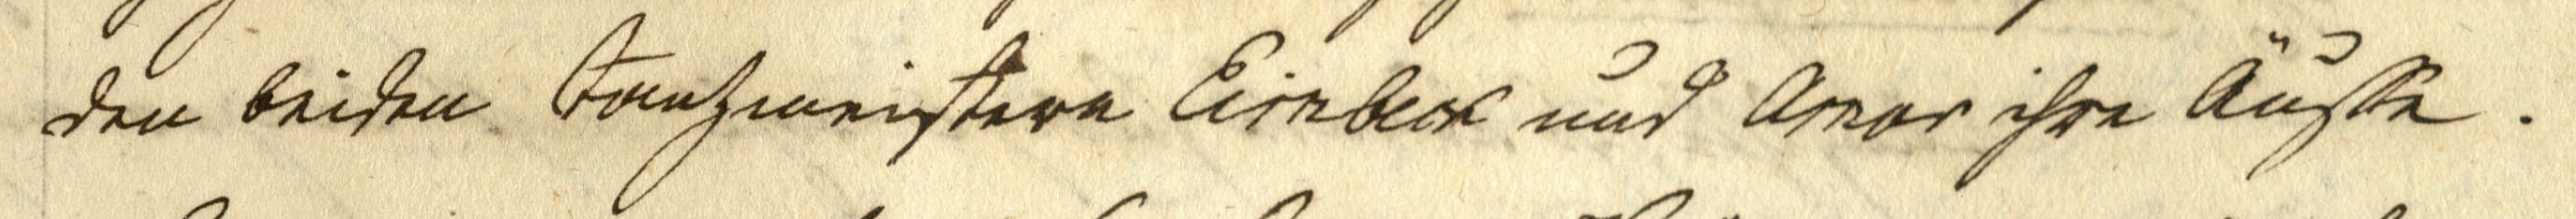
den beiden Tanzmiestern Eimbeck und Amor ihre Äusse-
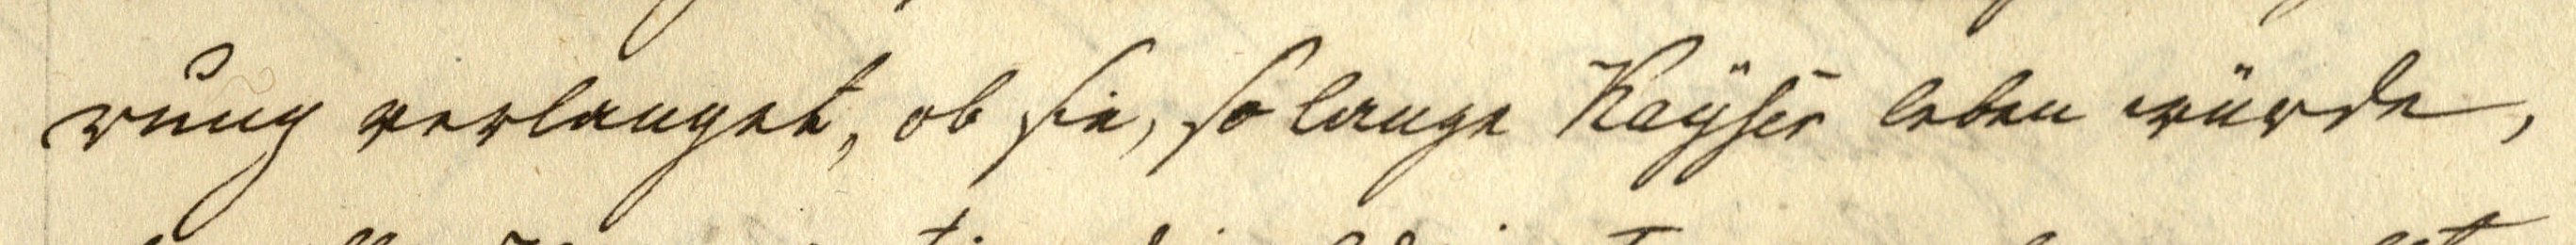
rung verlanget, ob sie, so lange Kayser leben würde,
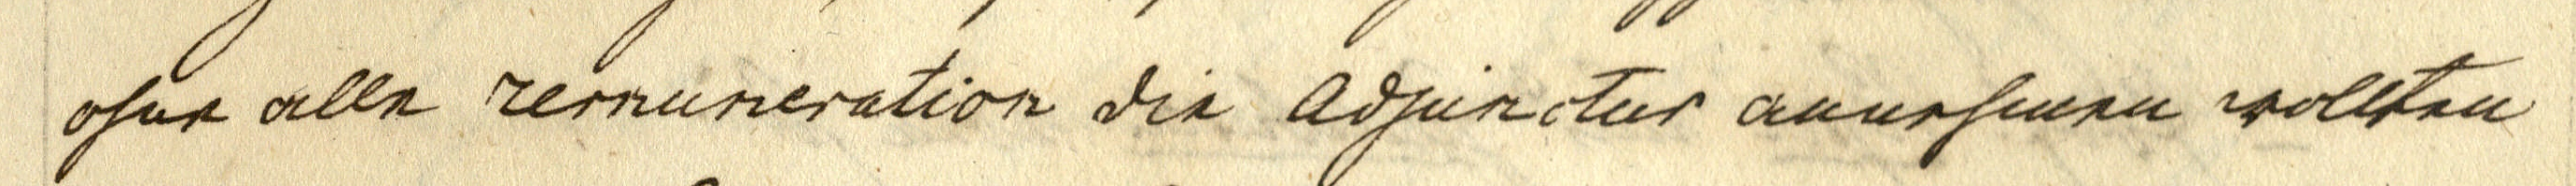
ohne alle remuneration die Adjunctur annehmen wollten
